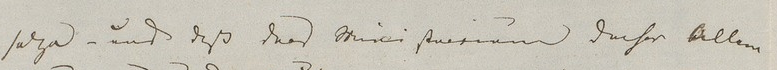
setze – und daß das Ministerium daher Allem
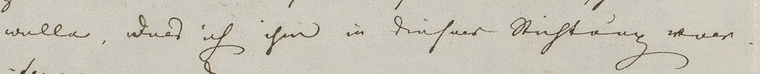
wolle, das ich ihm in dieser Richtung vor-
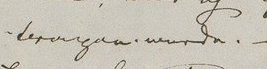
tragen werde. –
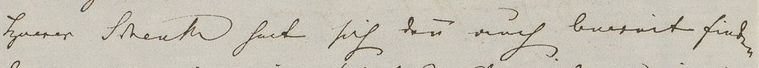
Herr Schenk hat sich dann auch bereit finden
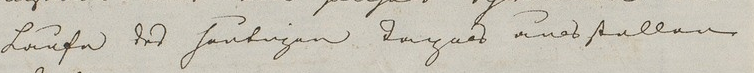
Laufe des heutigen Tages ausstellen
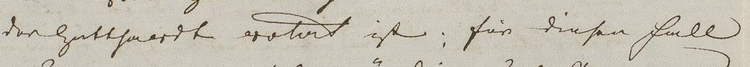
der Gotthardt votirt ist; für diesen Fall
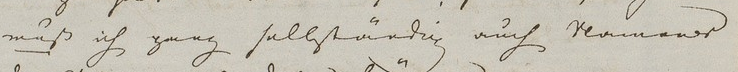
muß ich ganz selbständig auch Namens
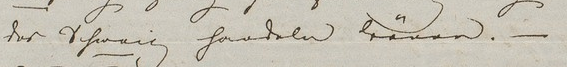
der Schweiz handeln könen. –
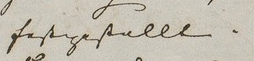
festgestellt. –
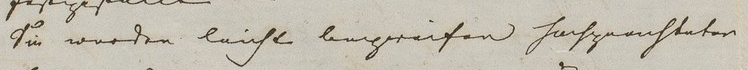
Sie werden leicht begreifen hochgeachteter
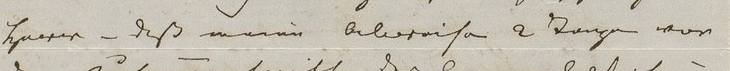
Herr – daß meine Abreise 2 Tage vor
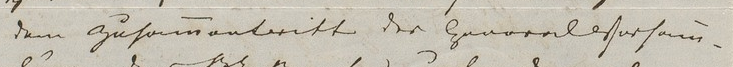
dem Zusammentritt der GeneralVersamm-
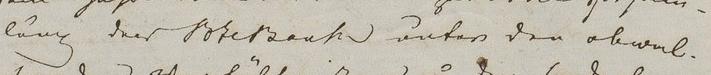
lung der BHBank unter den obwal-
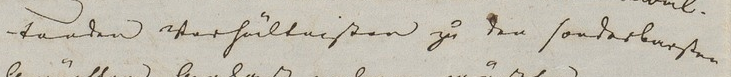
tenden Verhältnißen zu den sonderbarsten
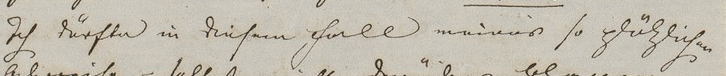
Ich dürfte in diesem Fall meiner so plötzlichen
